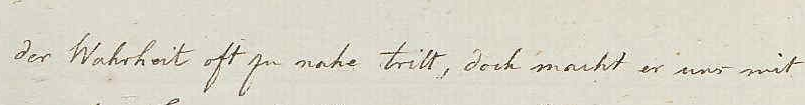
der Wahrheit oft zu nahe tritt, doch macht er uns mit
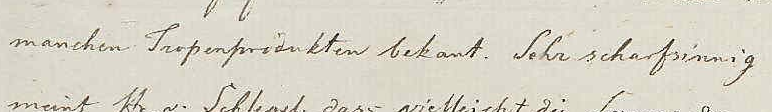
manchen Tropenprodukten bekant. Sehr scharfsinnig
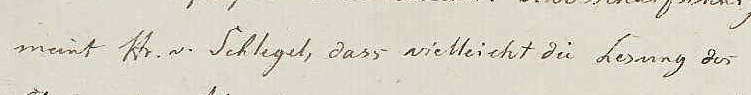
meint Hr. v. Schlegel, dass vielleicht die Lesung des
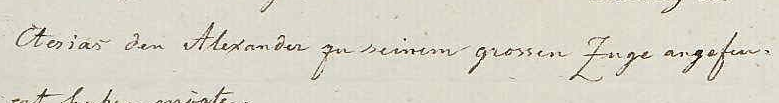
Ctesias den Alexander zu seinem grossen Zuge angefeu-
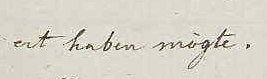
ert haben mögte.
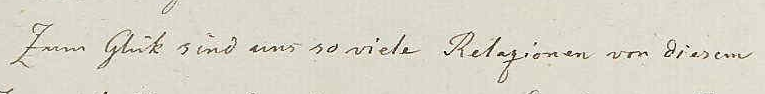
Zum Glük sind uns so viele Relazionen von diesem
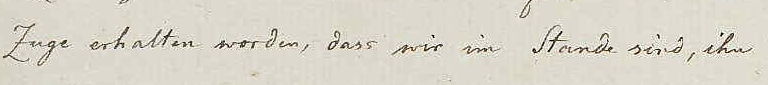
Zuge erhalten worden, dass wir im Stande sind, ihn
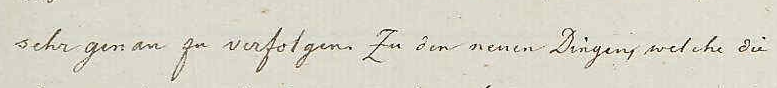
sehr genau zu verfolgen. Zu den neuen Dingen, welche die
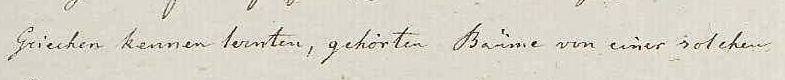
Griechen kennen lernten, gehörten Bäume von einer solchen
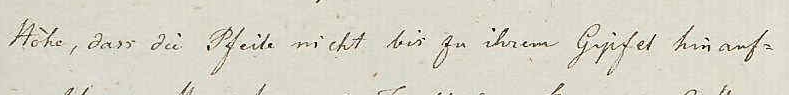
Höhe, dass die Pfeile nicht bis zu ihrem Gipfel hinauf-
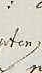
fand
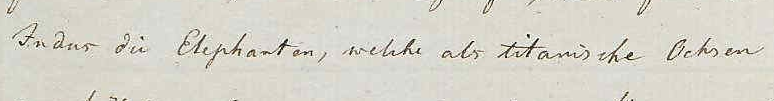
Indus die Elephanten, welche als titanische Ochsen
